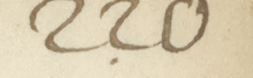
220.
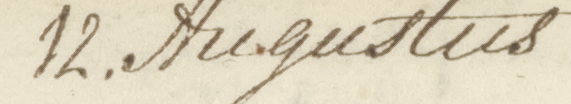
12. Augustus.
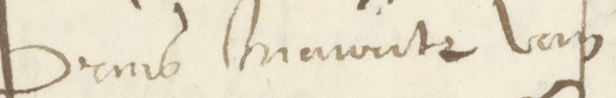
Prins Mauritz van
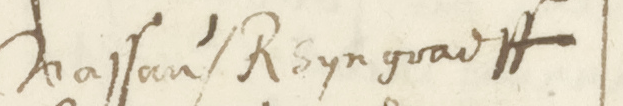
Nassau, Rhyngaeff
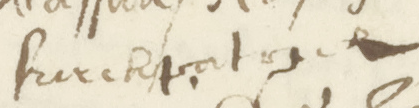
kirckpatrick
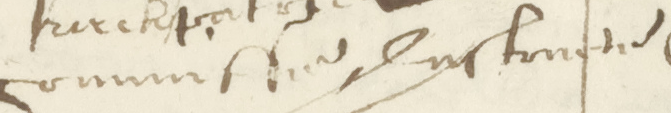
commissie, Instructie.
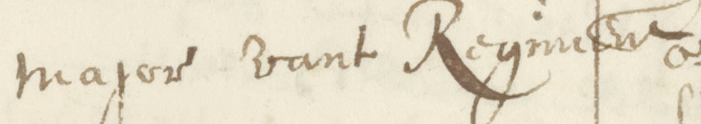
Major vant Regment
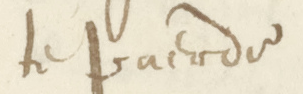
te Paerde
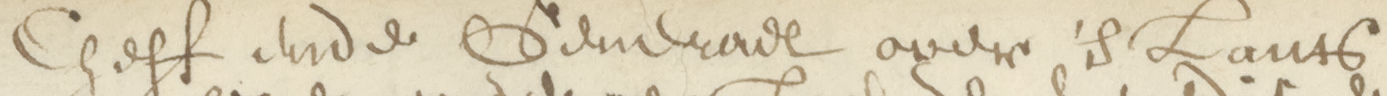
Cheff ende Generael over ‛s Lants
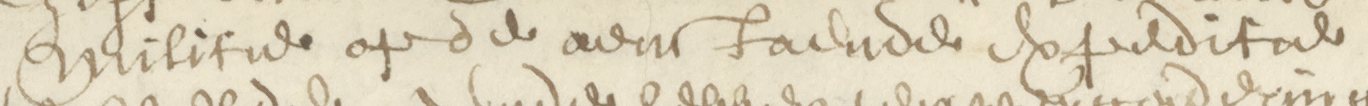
Militie opde aenstaende expeditie
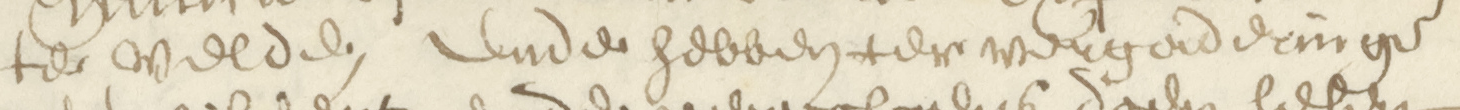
te Velde. Ende hebben ter vergaderinge
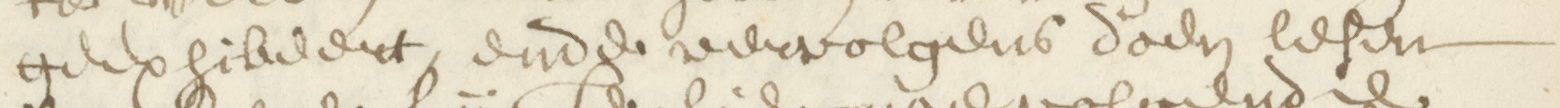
geexhibeert, ende vervolgens doen lesen
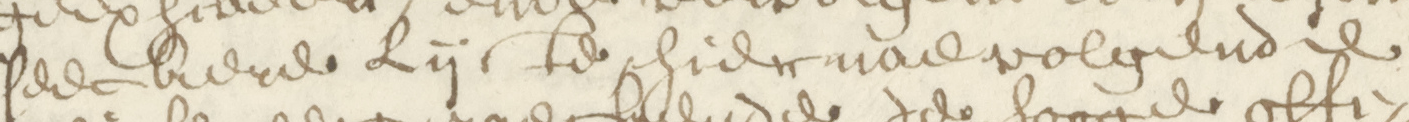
seeckere Lijste hier nae volgende
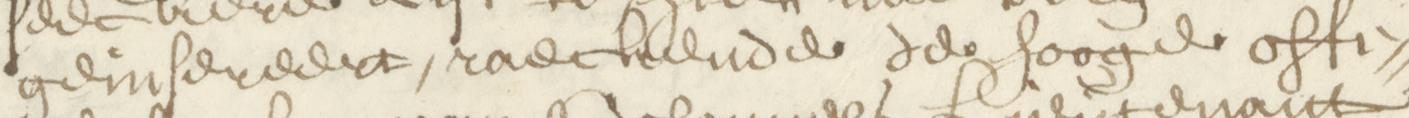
geinsereert, raeckende de hooge offi„
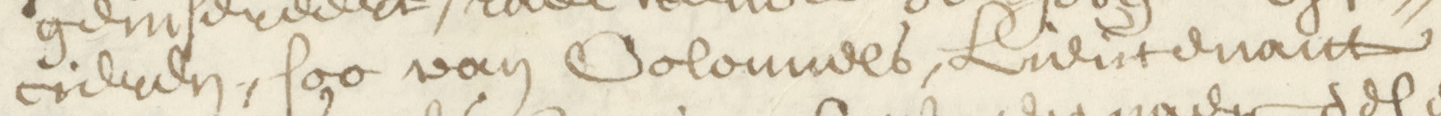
cieren, soo van Colonnels, Lieutenant
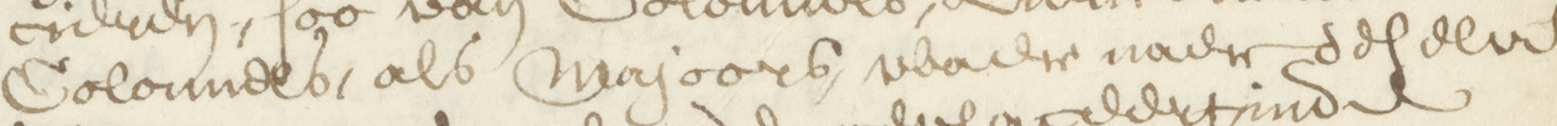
Colonnels, als Majoors, waer naer deselve
